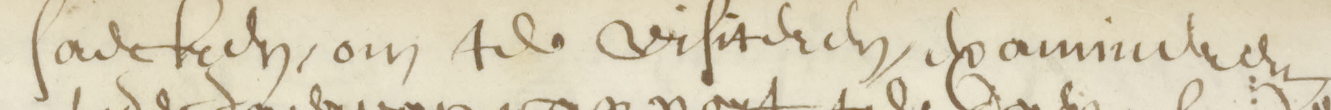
saecken, om te visiteren, examineren
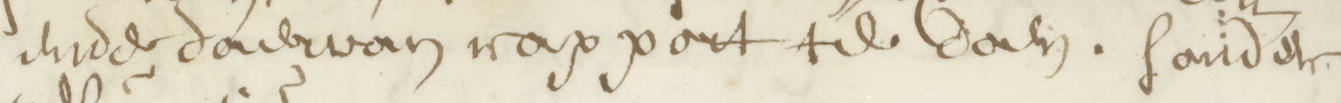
ende daervan rapport te doen, sonder
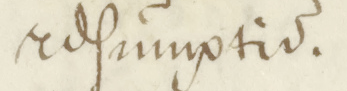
resumptie.
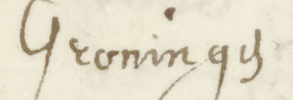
Groningen
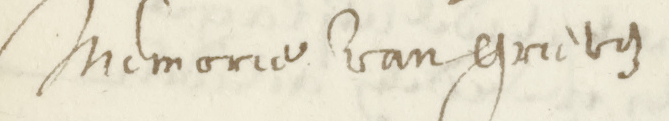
memorie van grieven
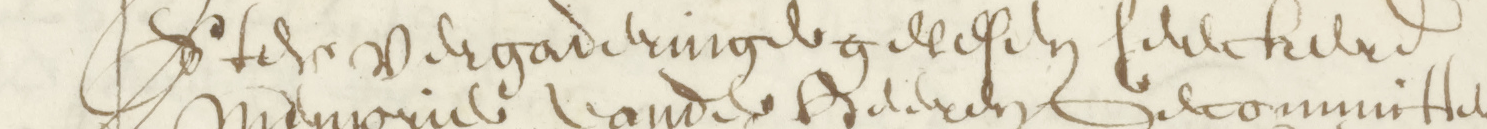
Is ter vergaderinge gelesen seeckere
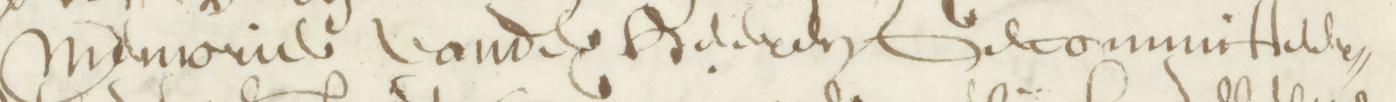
memorie van de Heeren Gecommitteer„,
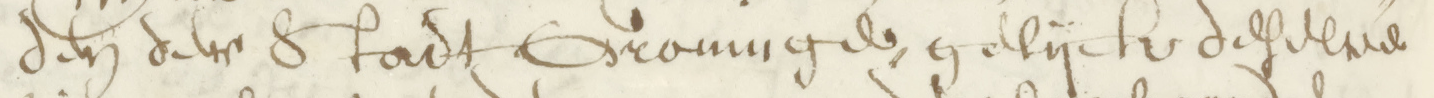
den der Stadt Groninge, gelijck deselve
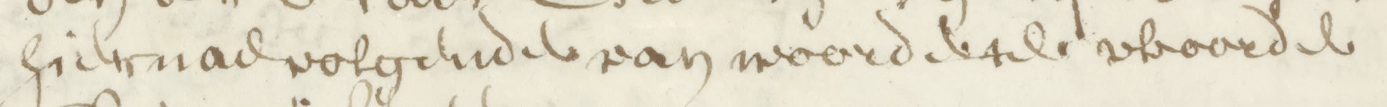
hiernaevolgende van woorde te woorde
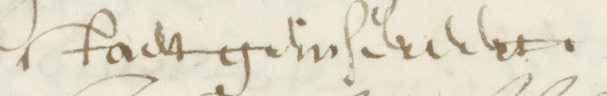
staet geinsereert.
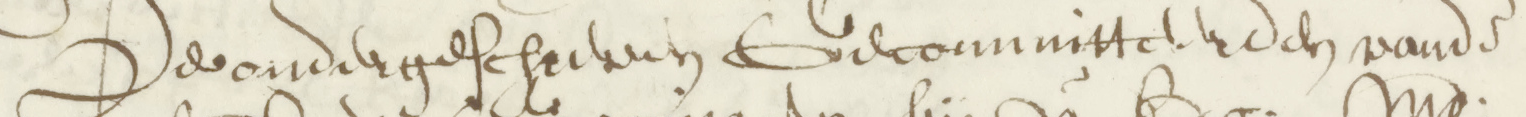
De ondergeschreven Gecommitteerden vande
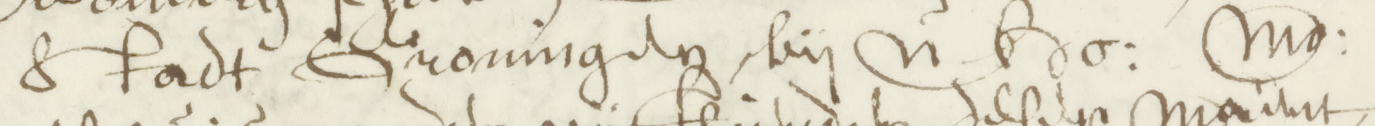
Stadt Groningen, bij U. Ho:Mo:
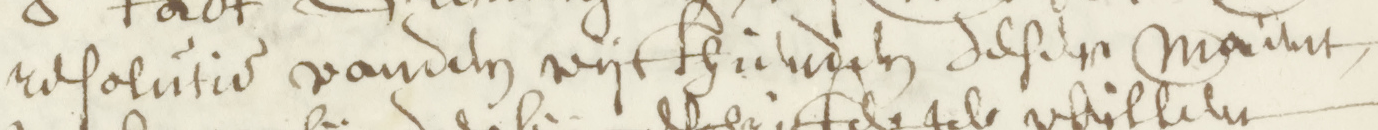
resolutie vanden vijfthienden deser Maent
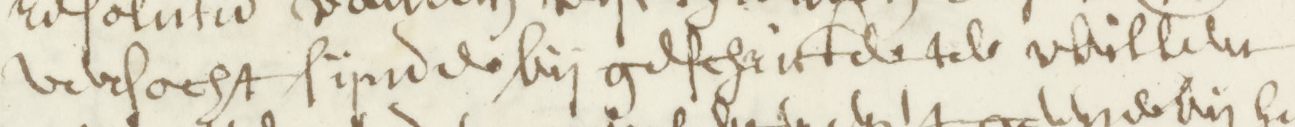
versocht sijnde, bij geschrifte te willen
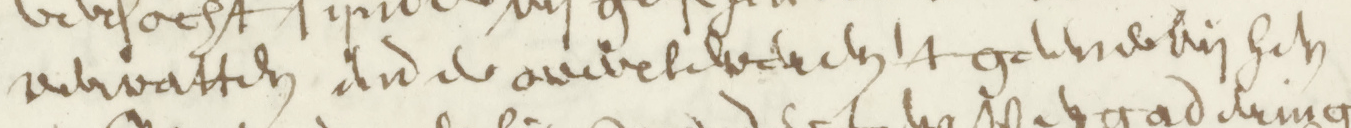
vervatten ende overleveren 't geene bij hen
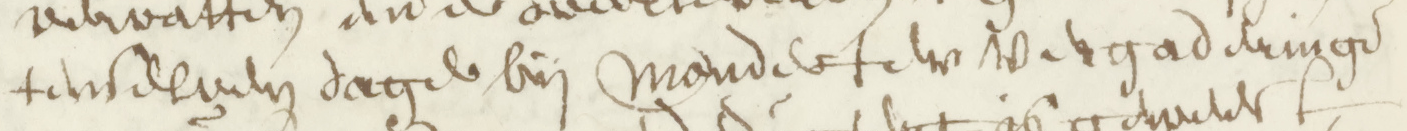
tenselven dage bij monde ter vergaderinge
